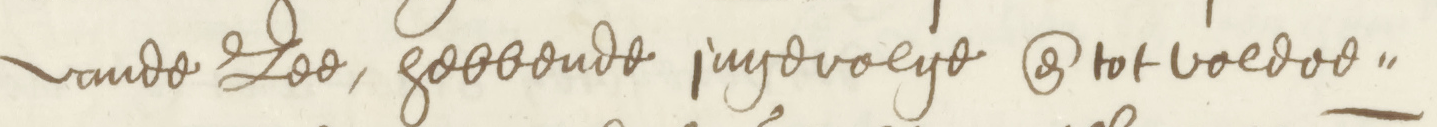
vande zee, hebbende ingevolge & tot voldoe„
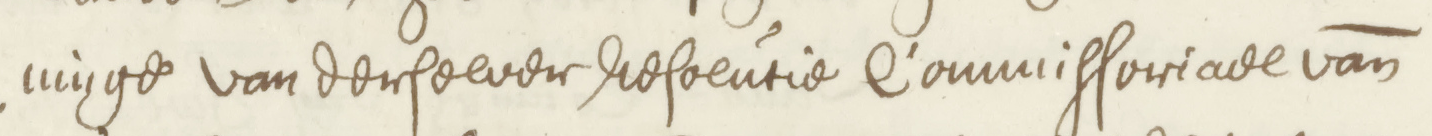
ninge van derselver resolutie commissoriael van
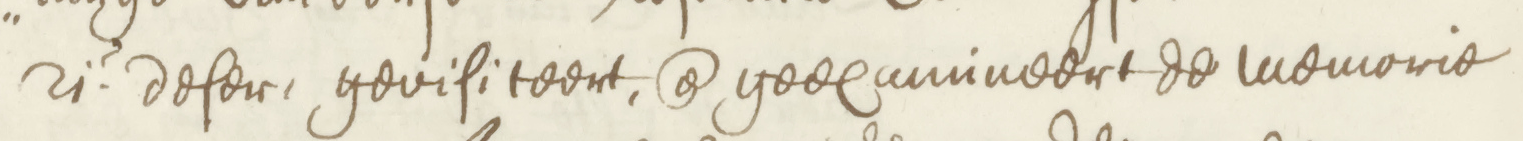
21e. deser, gevisiteert, & geexamineert de memorie
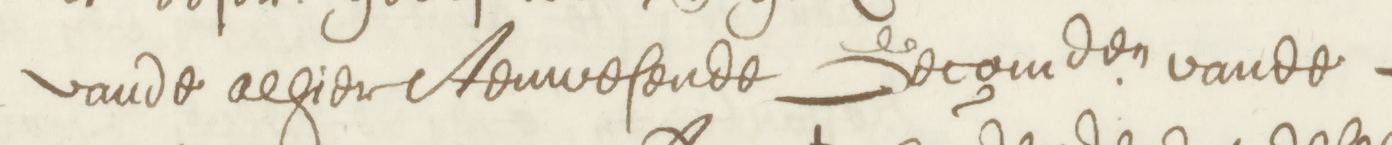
vande alhier Aenwesende Gecomden vande
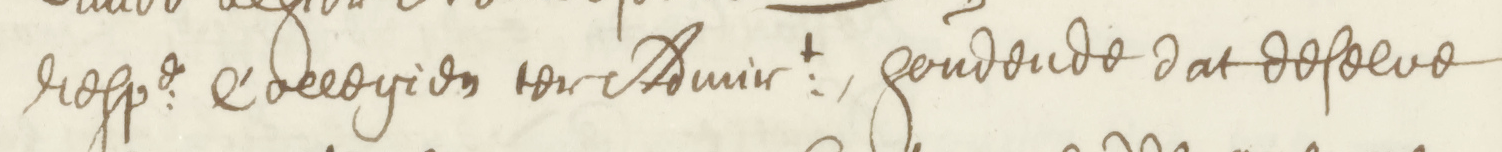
respe collegien ter Admirt:, houdende dat deselve
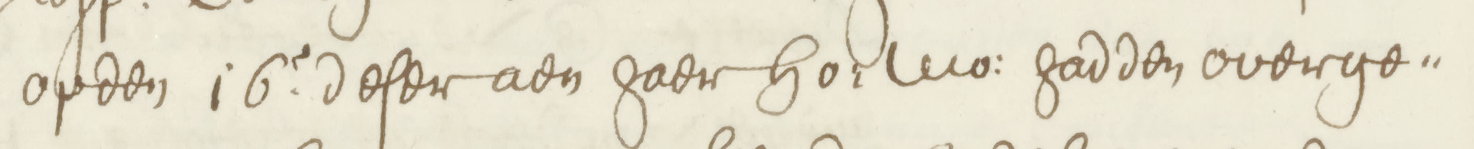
opden 16e. deser aen haer Ho:Mo: hadden overge„
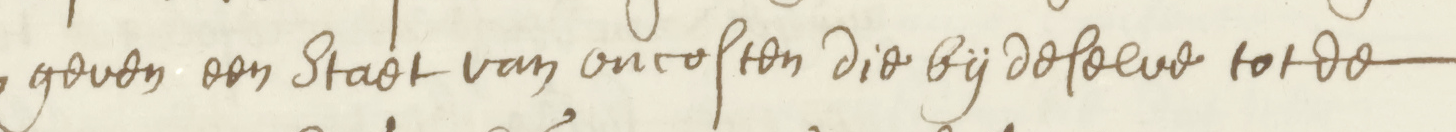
geven een Staet van oncosten die bij deselve tot de
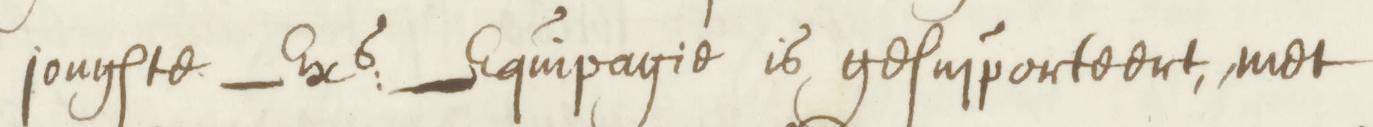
jongste Exs. Equipagie is gesupporteert, met
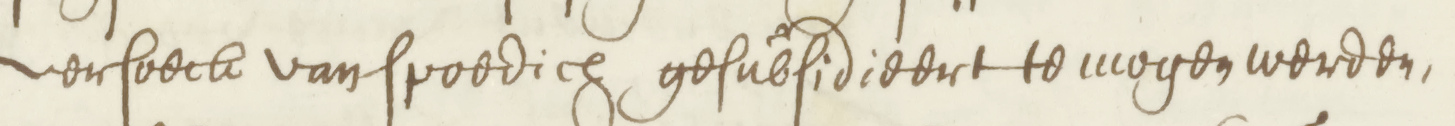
versoeck van spoedich gesubsidieert te mogen werden,
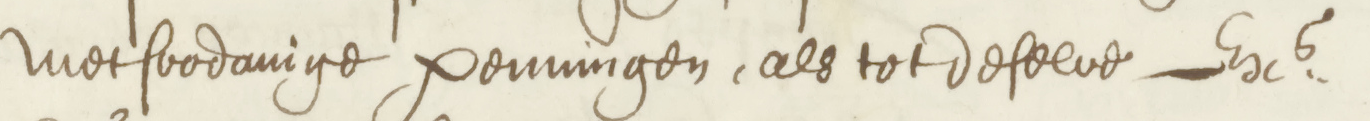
met soodanige penningen, als tot deselve Exs.
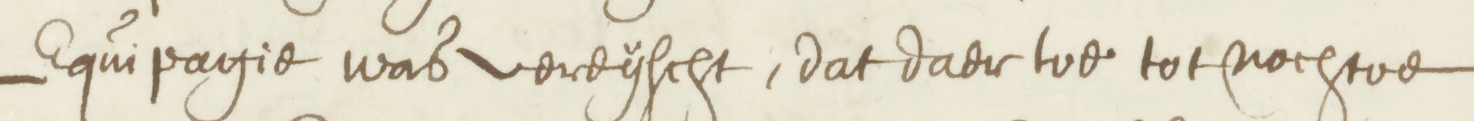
Equipagie was vereijscht, dat daer toe tot nochtoe
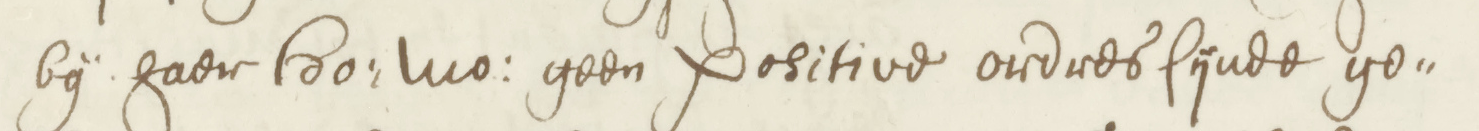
bij haer Ho:Mo: geen positive ordres sijnde ge„
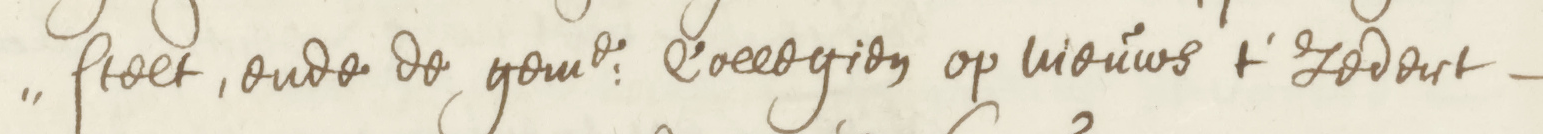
„stelt, ende de geme: collegien op nieuws t‛ zedert
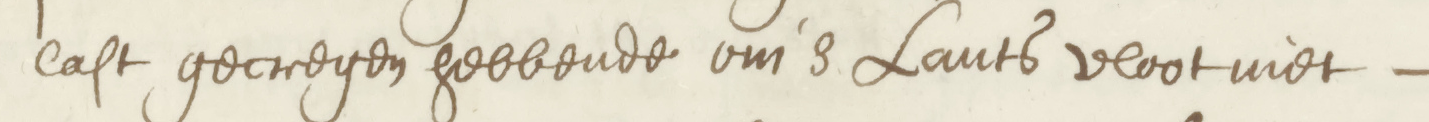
last gecregen hebbende om s Lants vloot niet
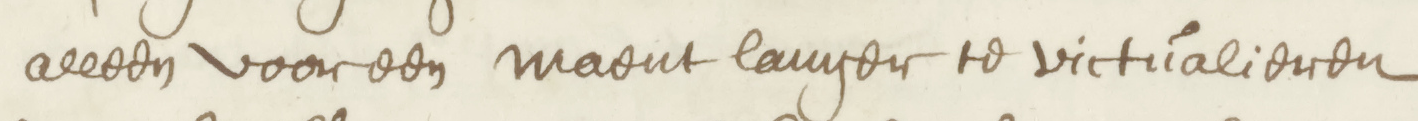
alleen voor een maent langer te victualieren
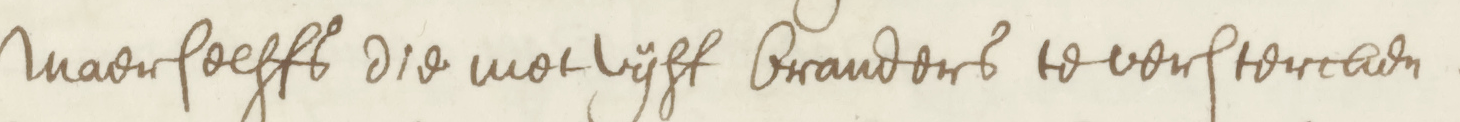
maer selffs die met vijff branders te verstercken
